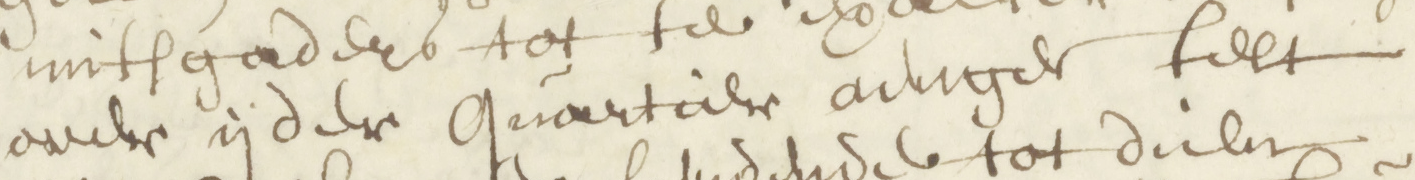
over ijder Quartier aengestelt
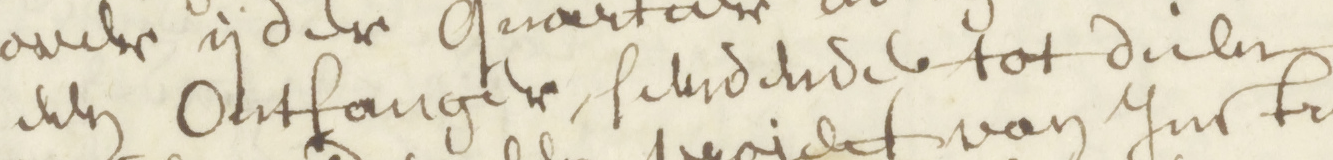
een Ontfanger, sendende tot dien
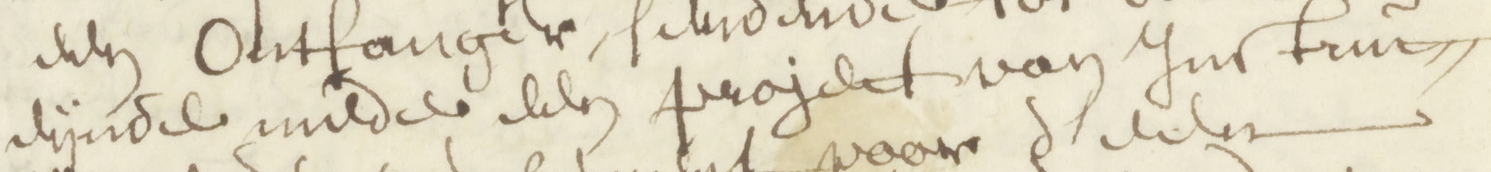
eijnde mede een project van Instruc„
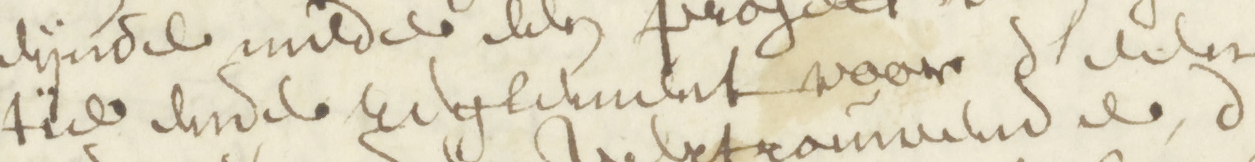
tie ende reglement voor d‛een
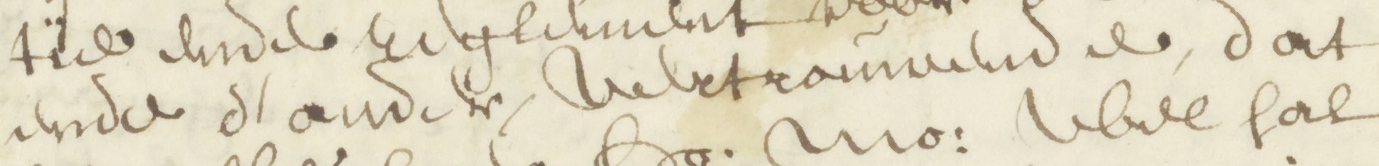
ende d'ander, vertrouwende, dat
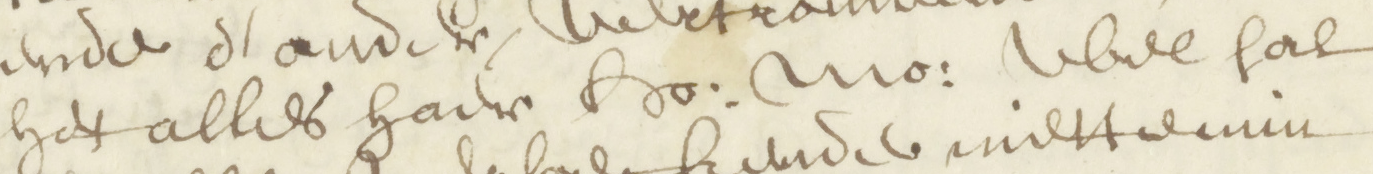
het alles haer Ho:Mo: wel sal
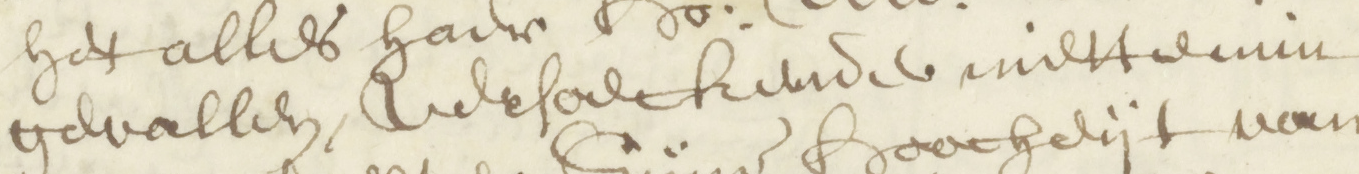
gevallen, versoeckende niettemin
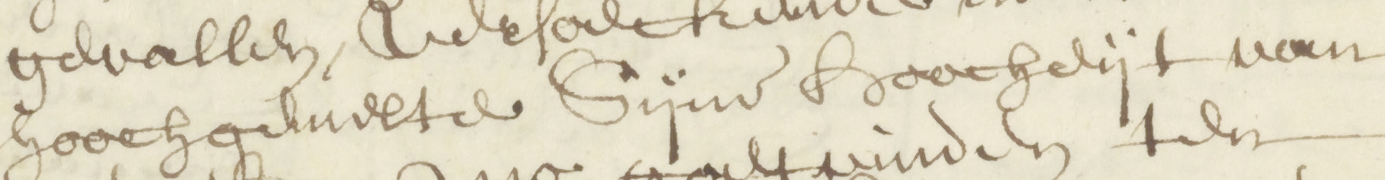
hoochgemelte Sijne Hoocheijt van
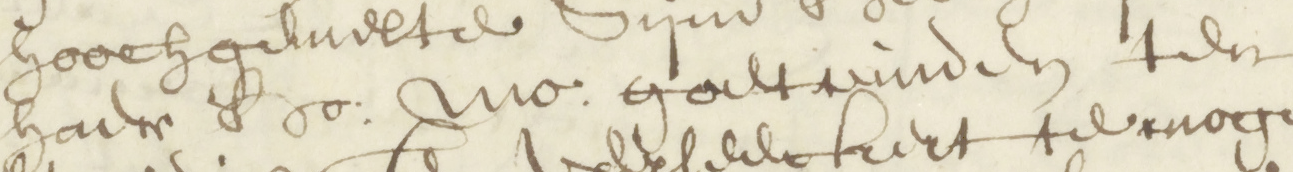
haer Ho:Mo: goetvinden ten
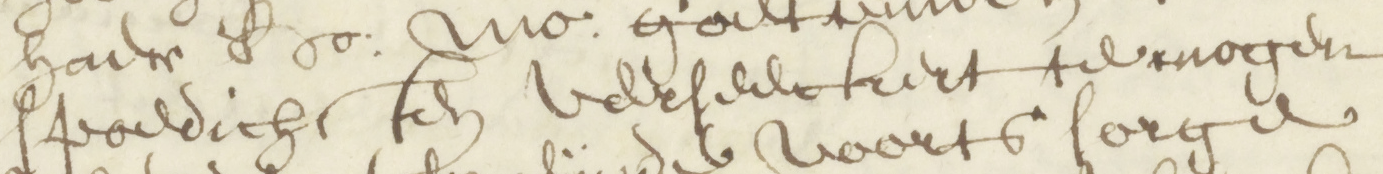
spoedichsten verseeckert te mogen
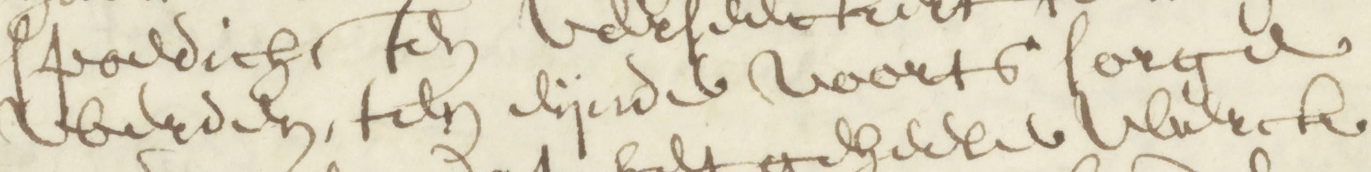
werden, ten eijnde voorts sorge
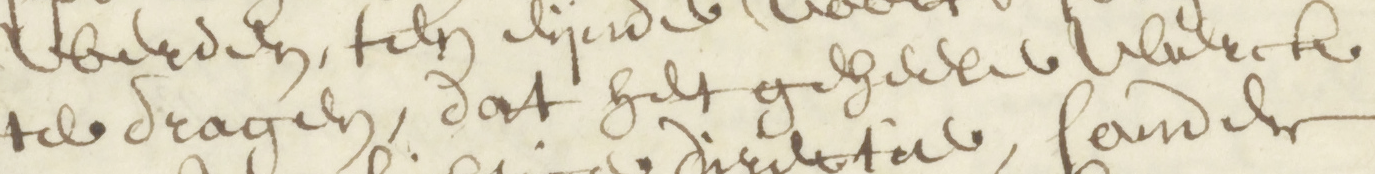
te dragen, dat het geheele werck
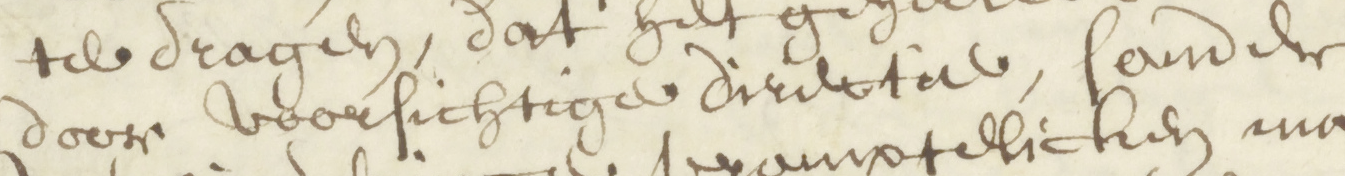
door voorsichtige directie, sonder
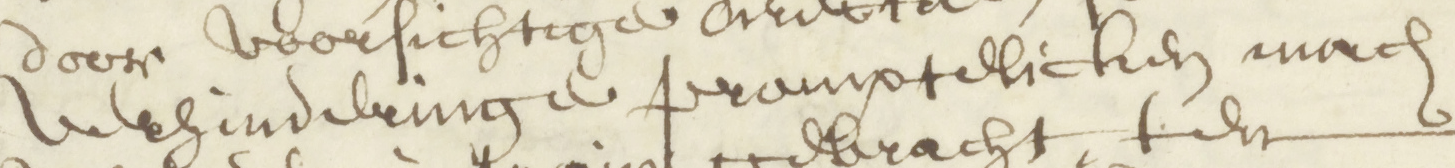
verhinderinge promptelicken mach
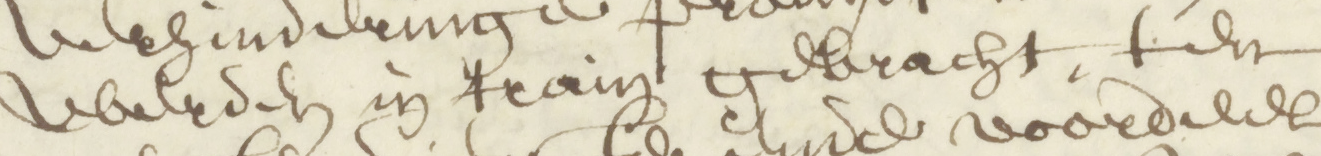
werden in train gebracht, ten
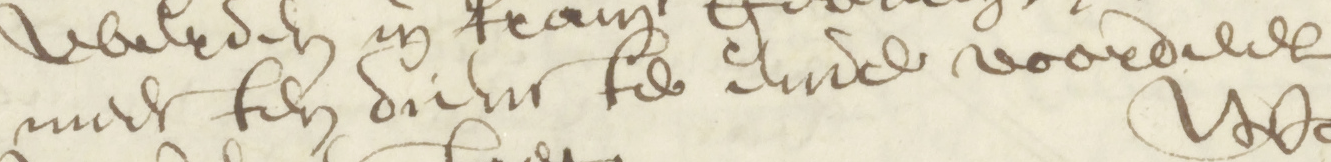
meesten dienste ende voordeel
